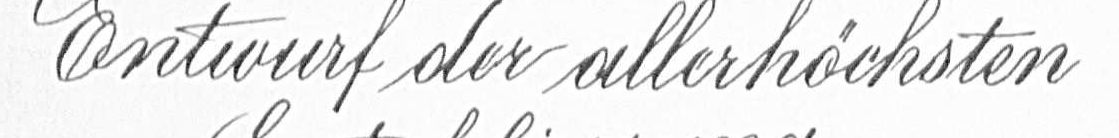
Entwurf der allerhöchsten
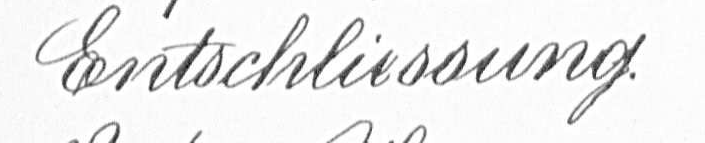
Entschliessung
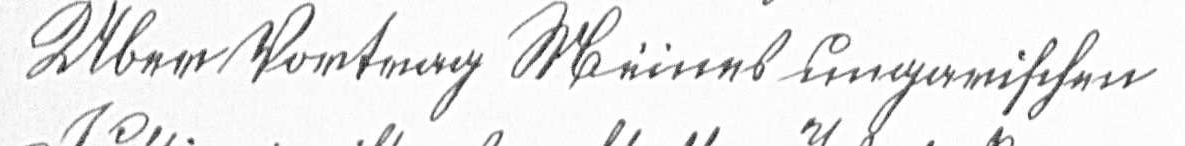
Über Vortrag Meines ungarischen
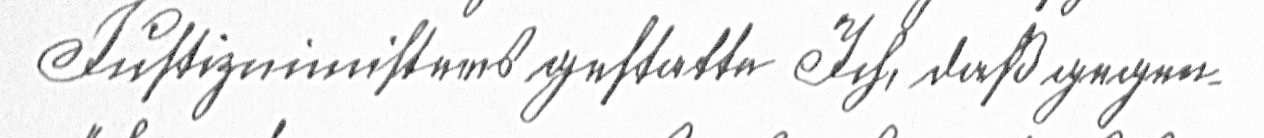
Justizministers gestatte Ich, daß gegen¬
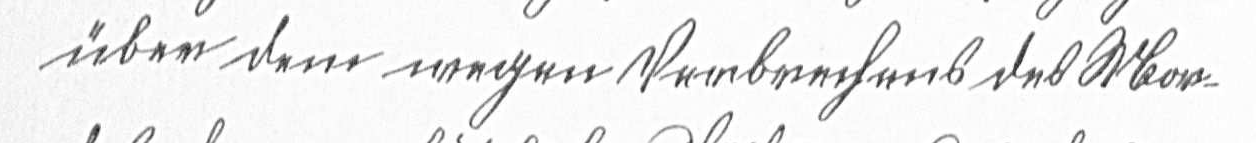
über dem wegen Verbrechens des Mor¬
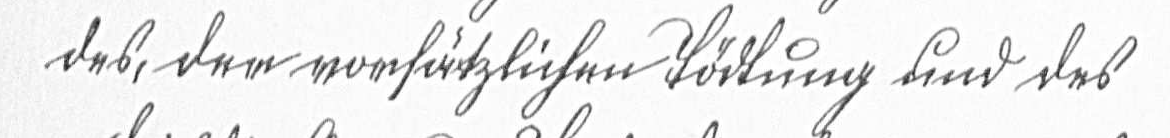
des, der vorsätzlichen Tödtung und des
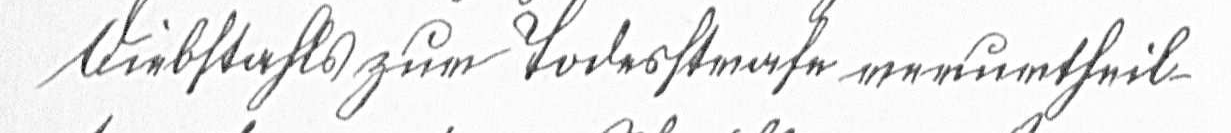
Diebstahls zur Todesstrafe verurtheil¬
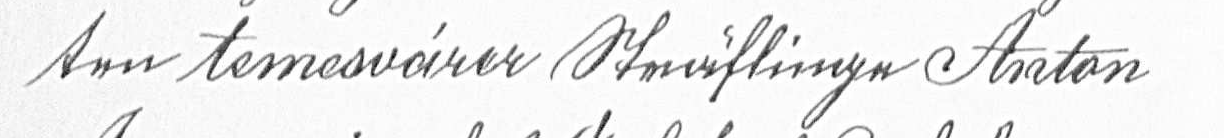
ten temesvárer Sträflinge Anton
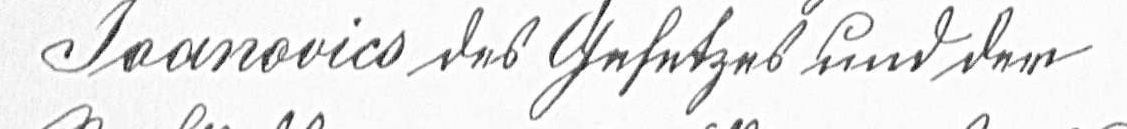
Ioanovics des Gesetzes und der
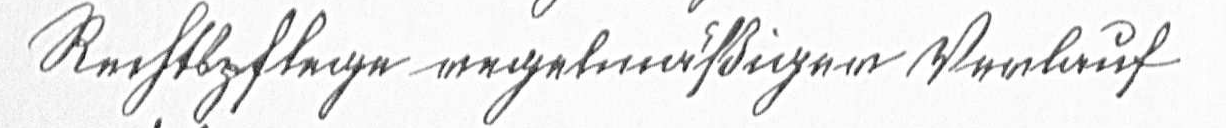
Rechtspflege regelmäßiger Verlauf
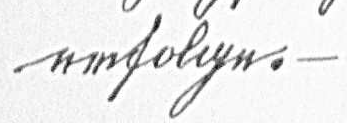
erfolge.
